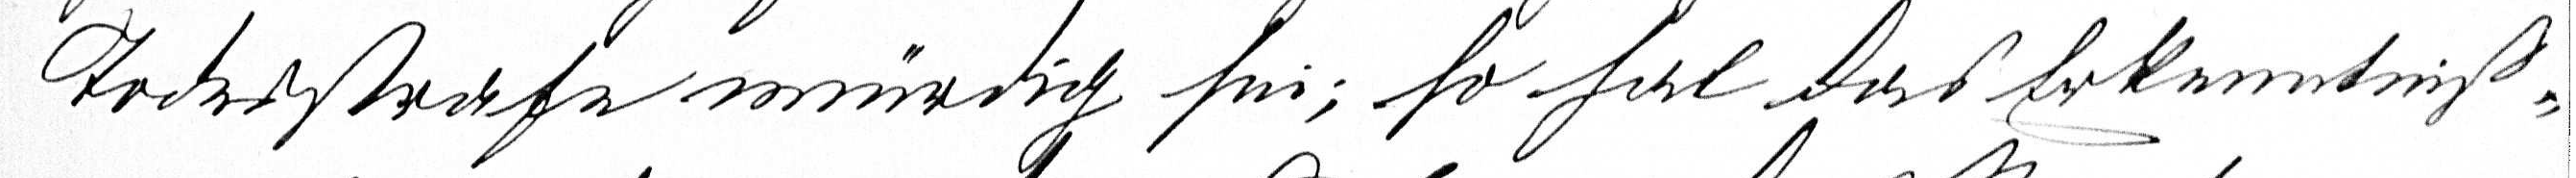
Todesstrafe würdig sei; so hat das Erkenntniß¬
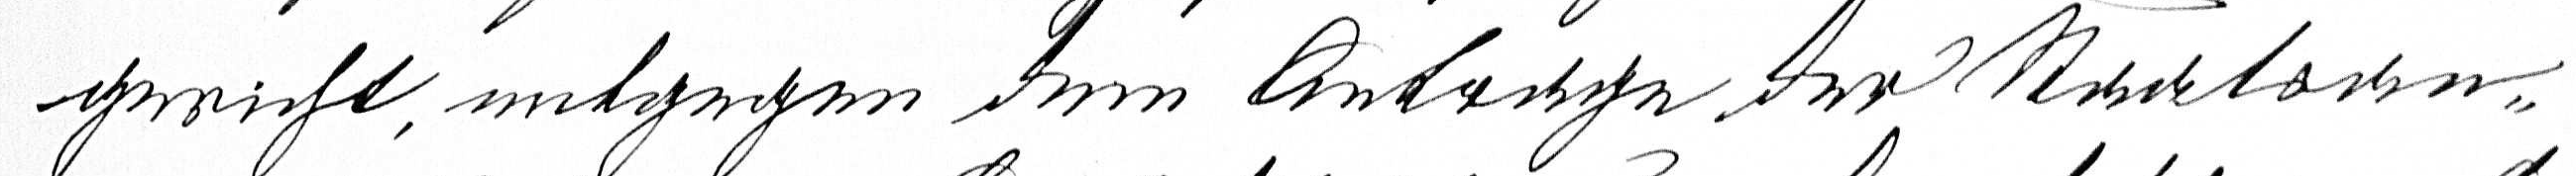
gericht, mitgegen dem Antrage der Staatsan¬
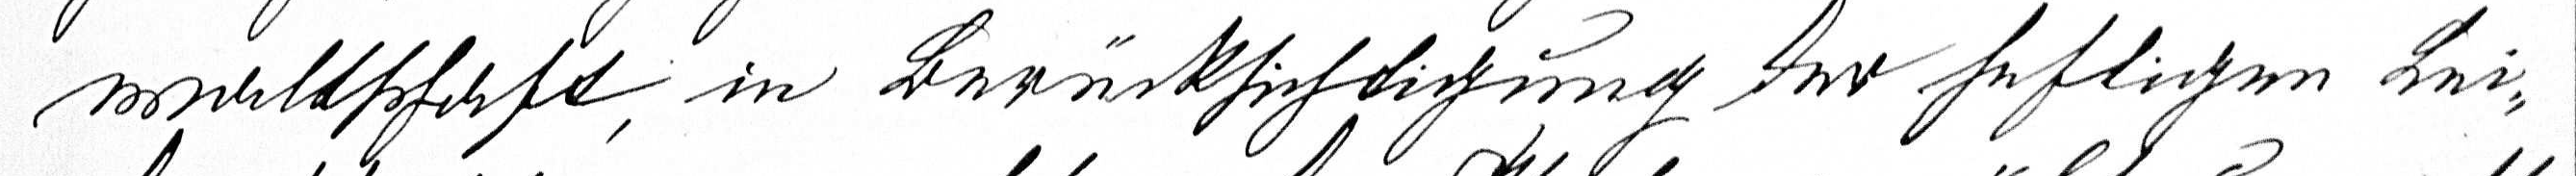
waltschaft, in Berücksichtigung der heftigen Lei¬
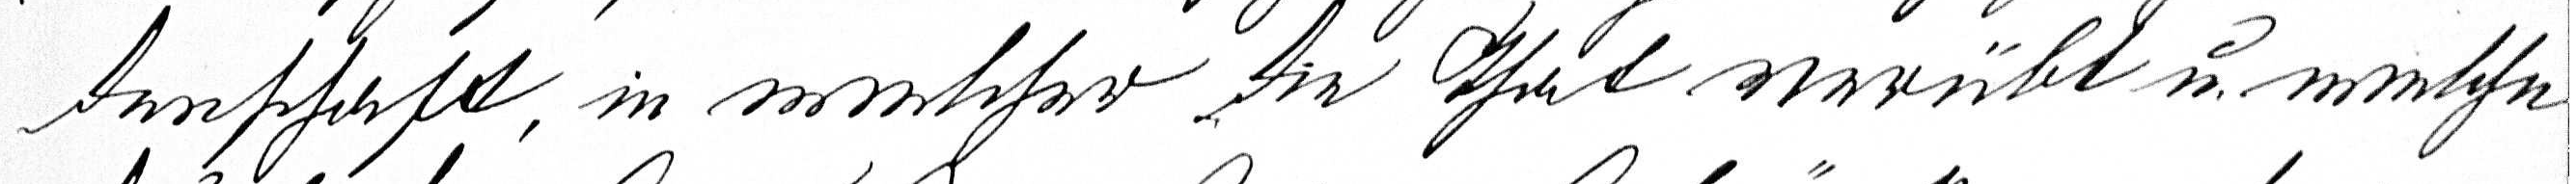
denschaft, in welcher die That verübt u. welche
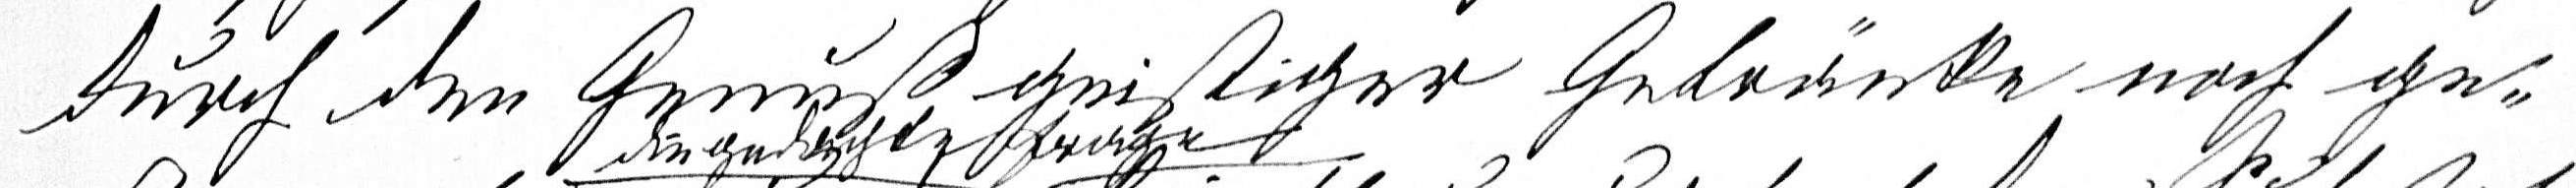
durch den Genuß geistiger Getränke noch ge¬
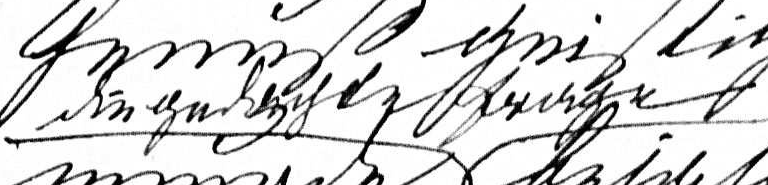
die gedachte Frage
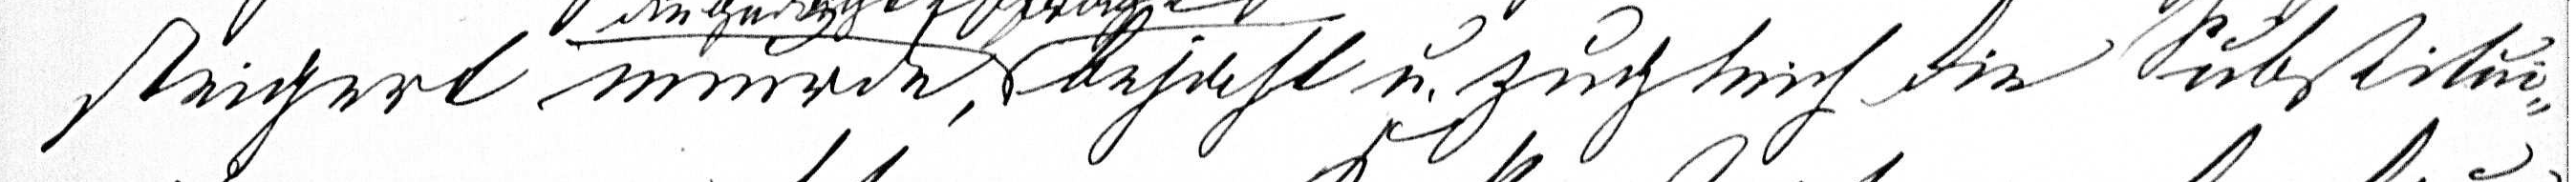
steigert wurde, bejaht u. zugliech die Subtitui¬
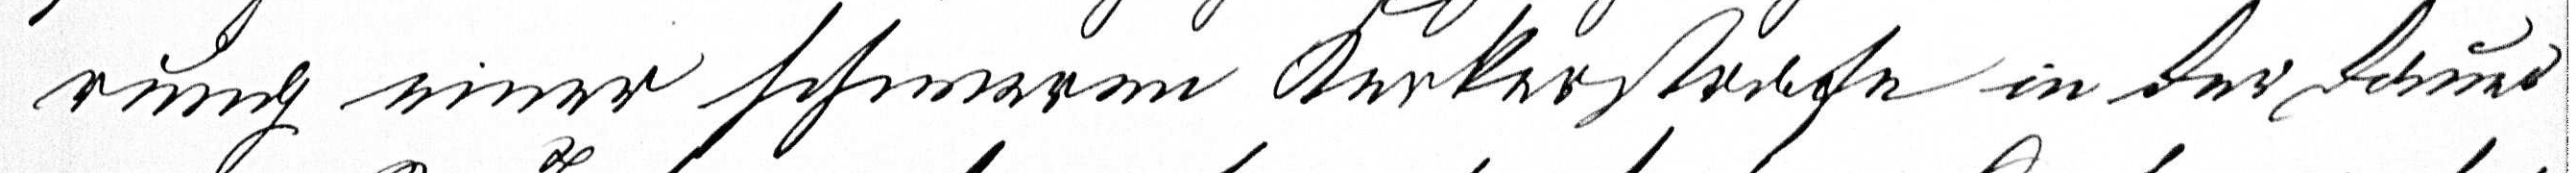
rung einer schweren Kerkerstrafe in der Dauer
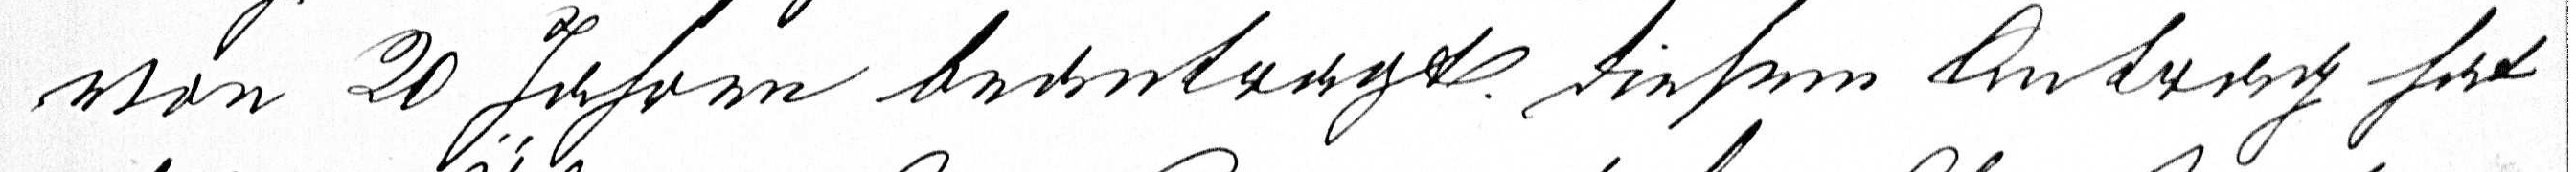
von 20 Jahren beantragt. Diesem Antrag hat
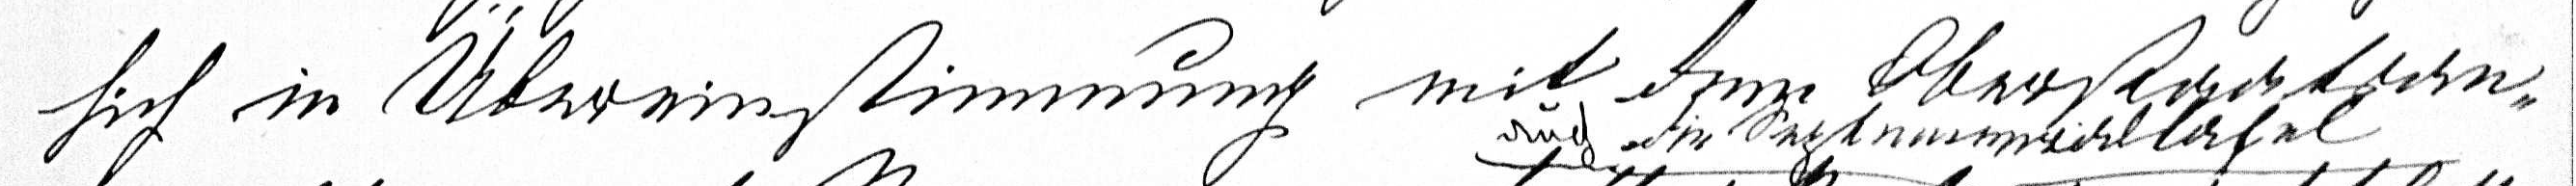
sich in Übereinstimmung mit dem Oberstaatsan¬
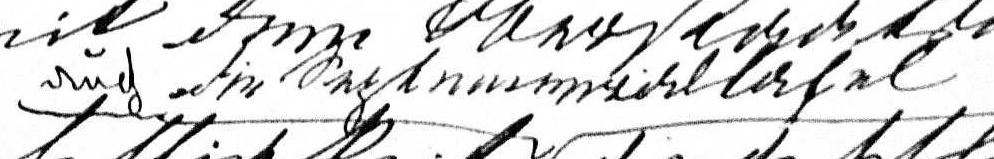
auch die Septemviralttafel
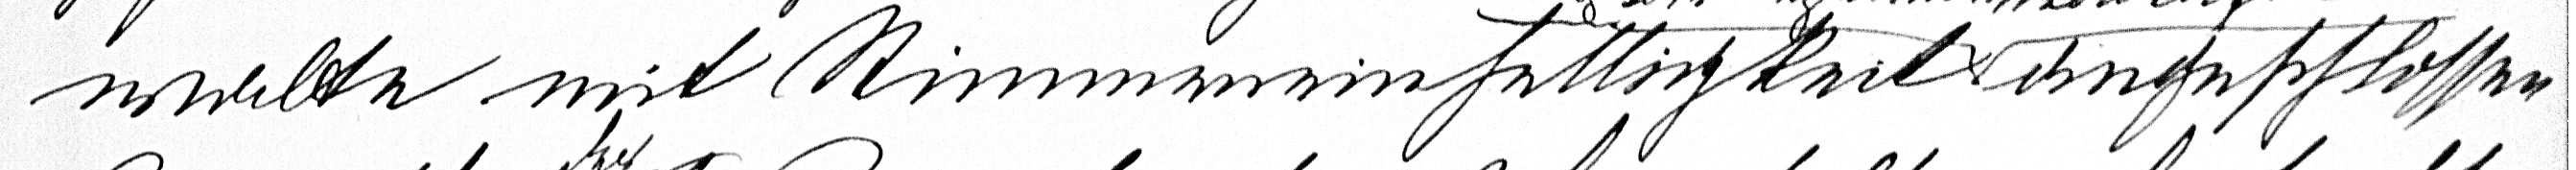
walte mit Stimmeneinhelligkeit
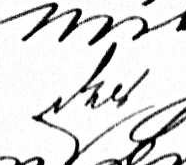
der
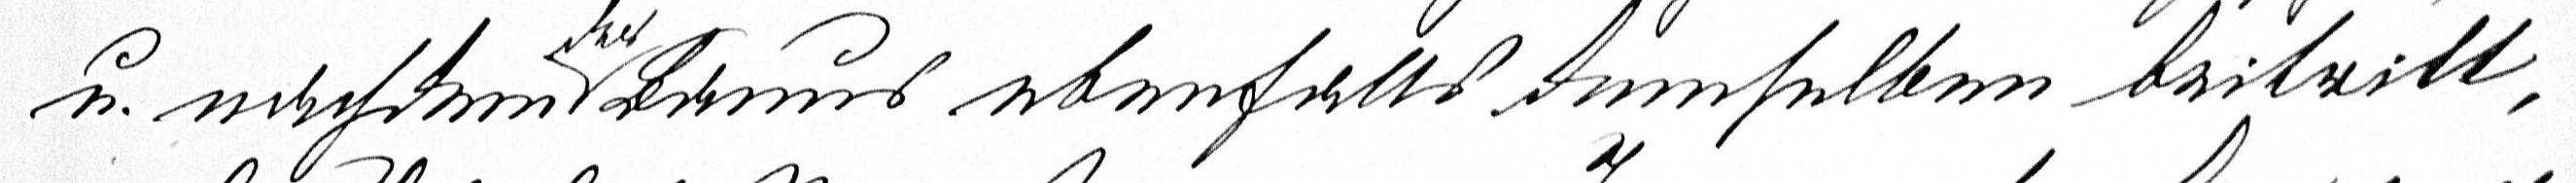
u. nachdem Banus ebenfalls demselben beitritt,
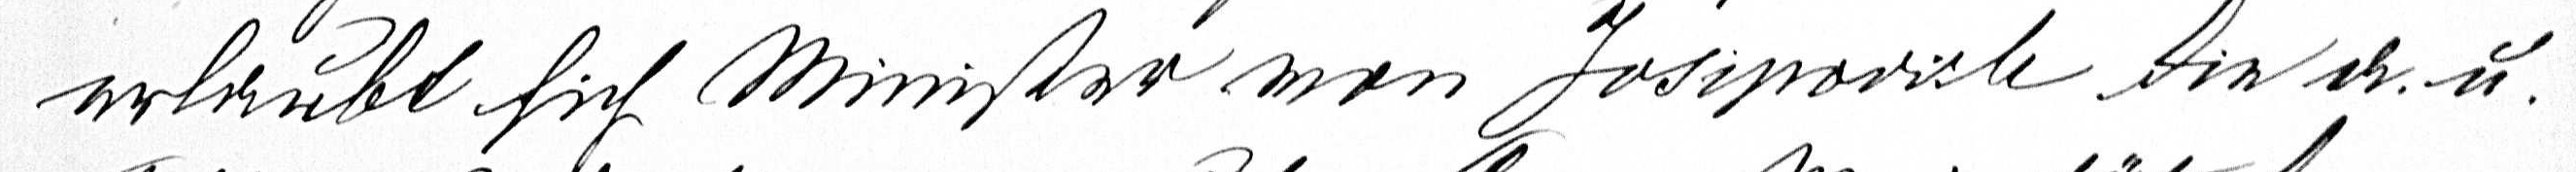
erlaubt sich Minister von Josipovich die a.u.
